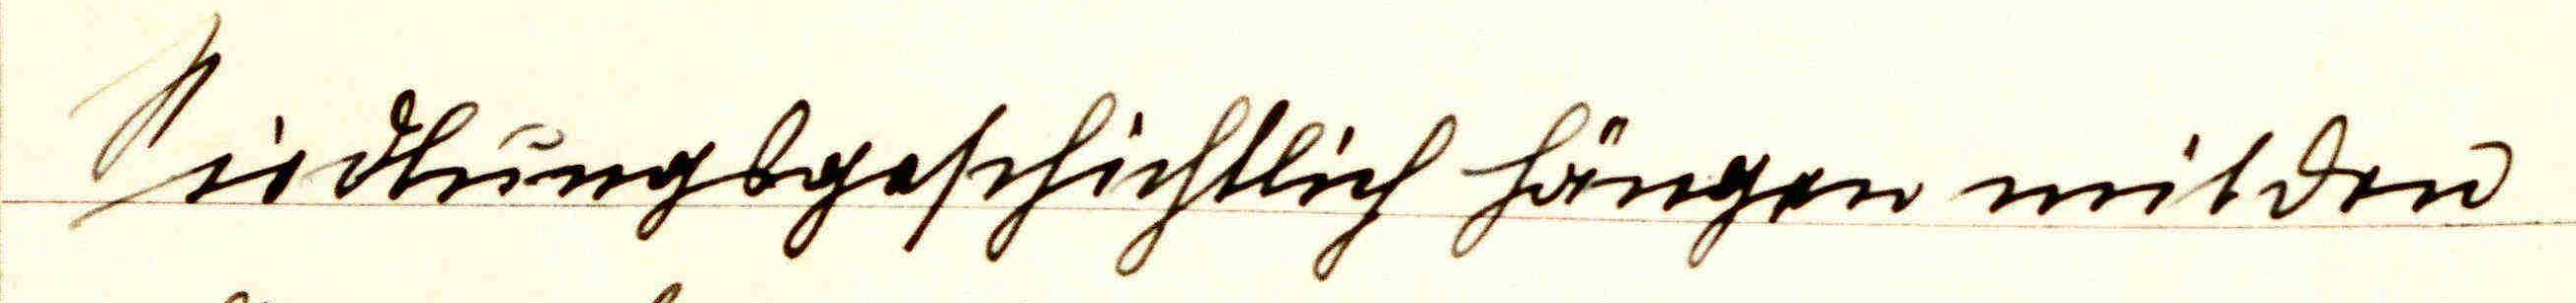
Siedlungsgeschichtlich hängen mit den
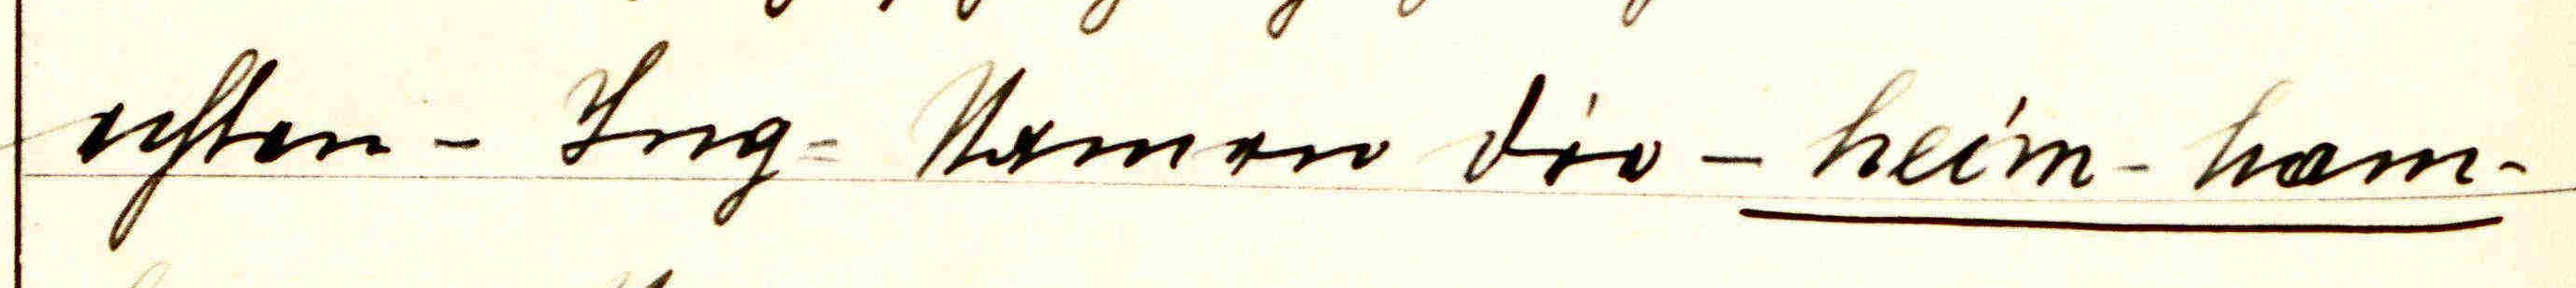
echten - Ing-Namen die - heim - ham -
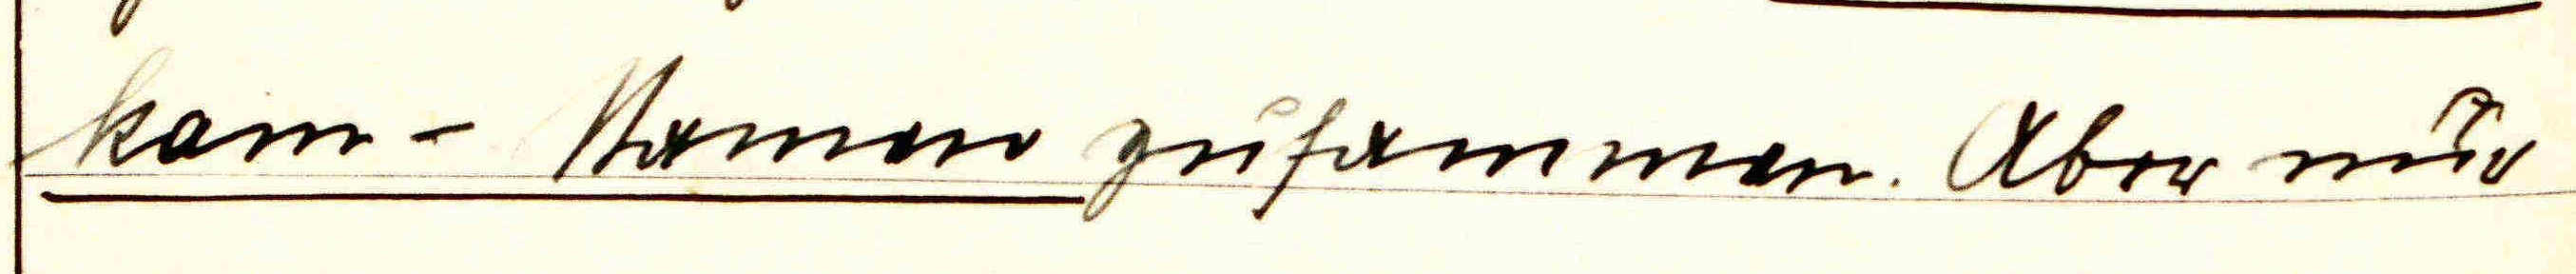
kam - Namen zusammen. Aber nur
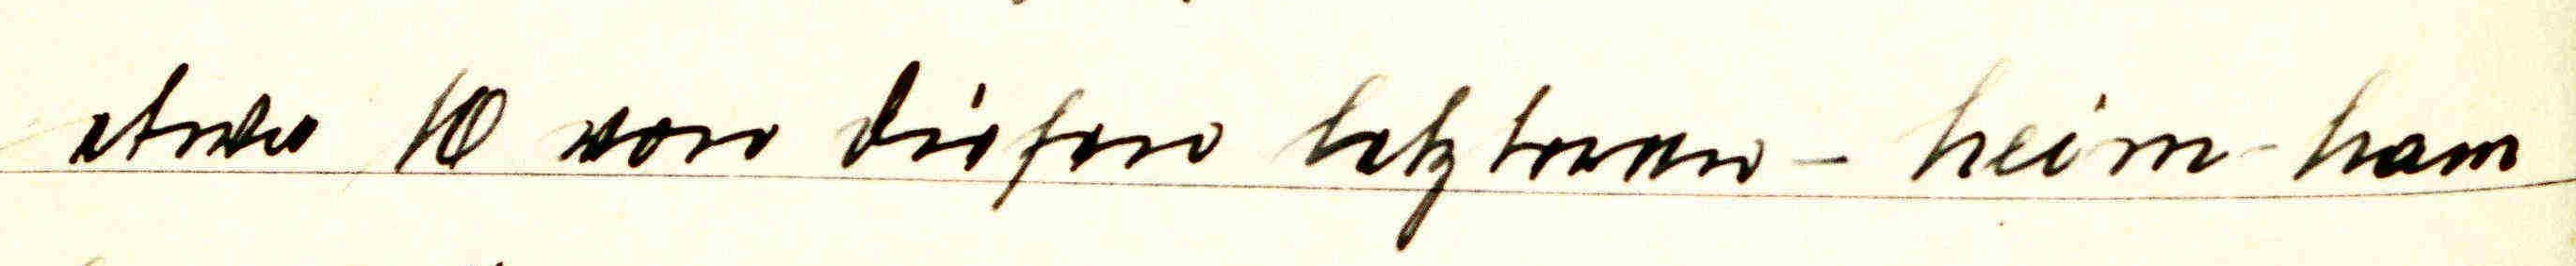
etwa 10 von diesen letzteren -heim -ham
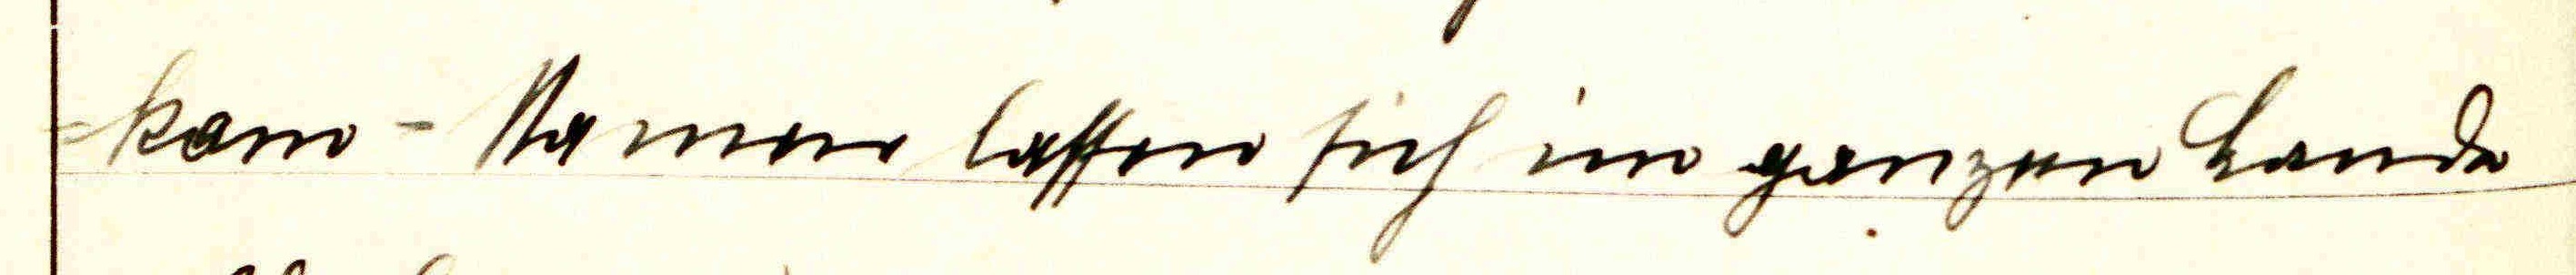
-kam - Namen lassen sich im ganzen Lande
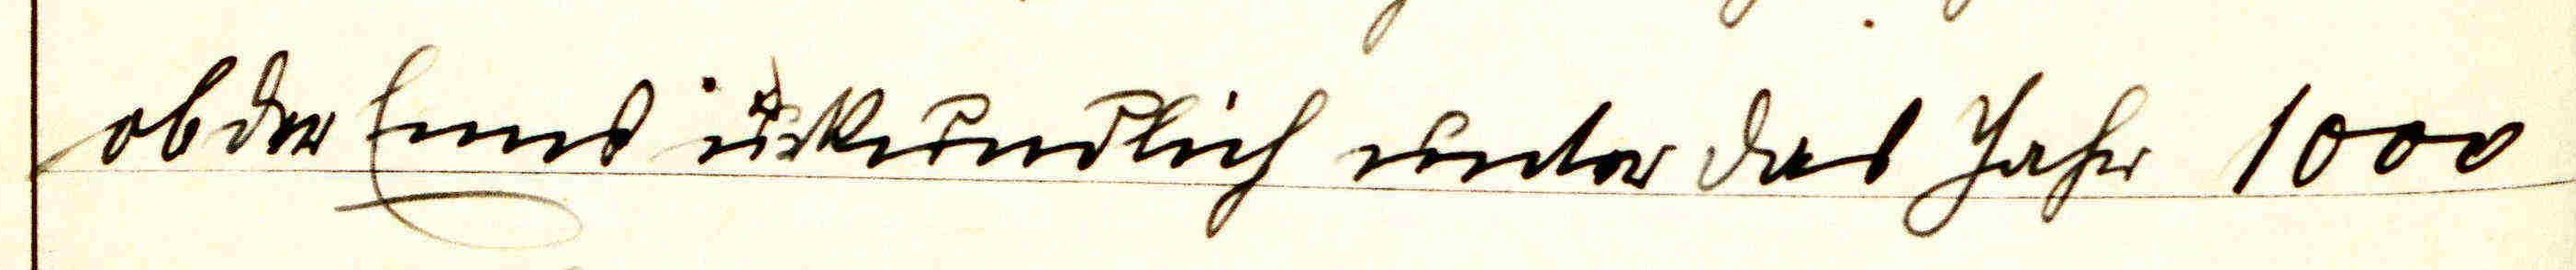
ob der Enns urkundlich unter das Jahr 1000
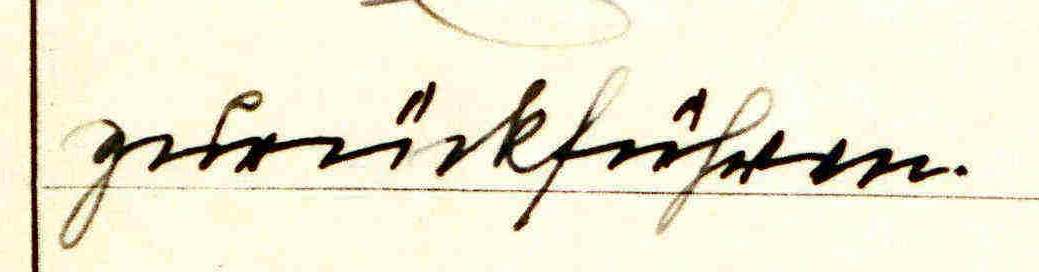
zurückführen.
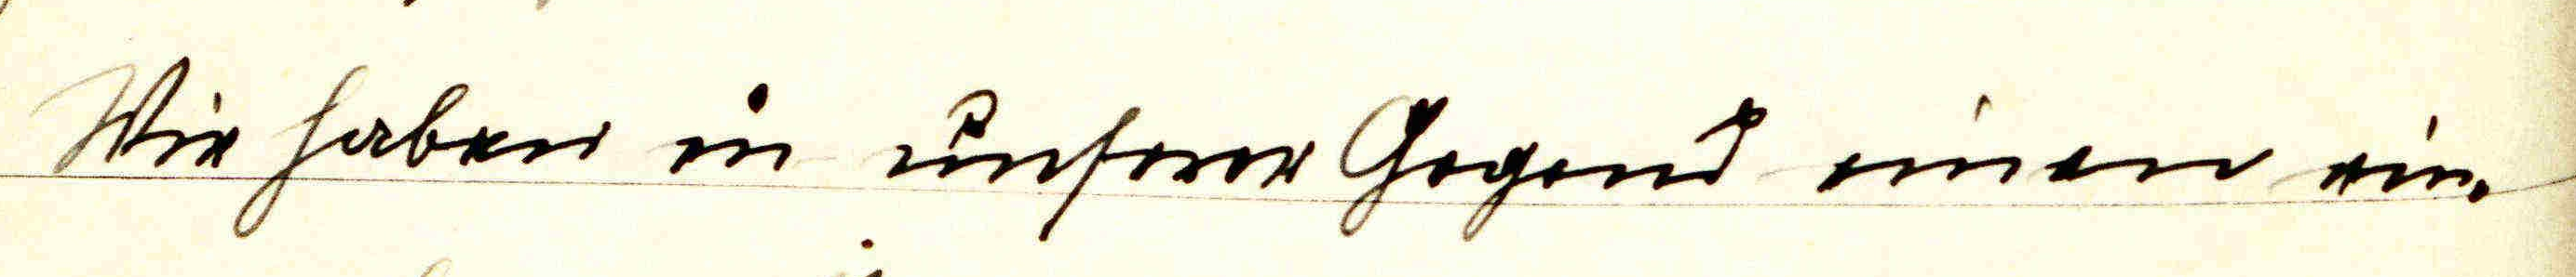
Wir haben in unserer Gegend einen ein-
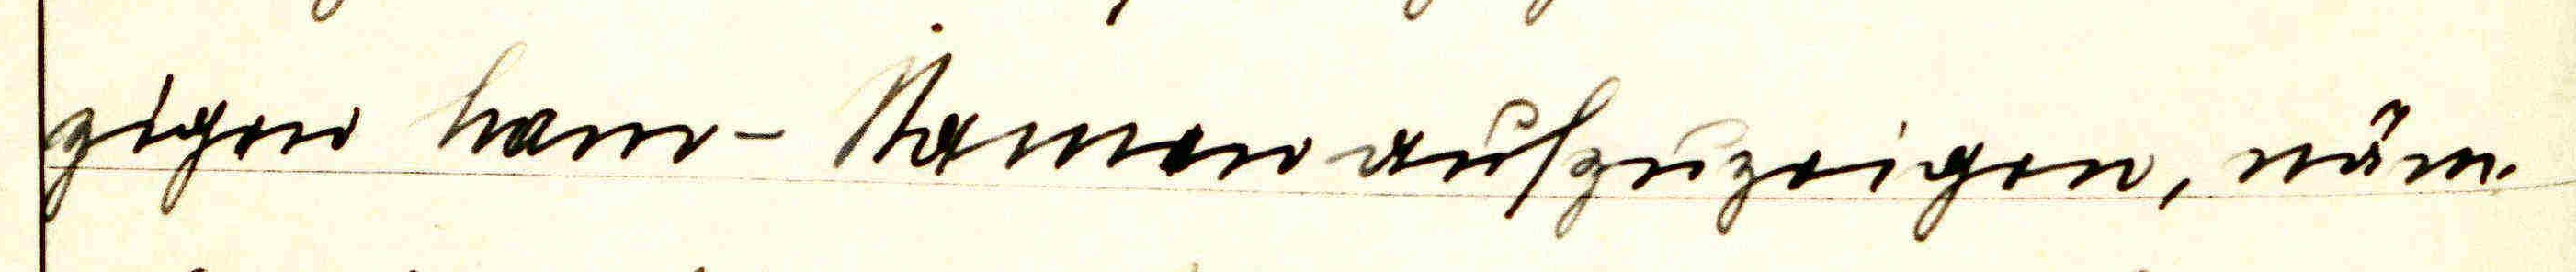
zigen ham- Namen aufzuzeigen, näm-
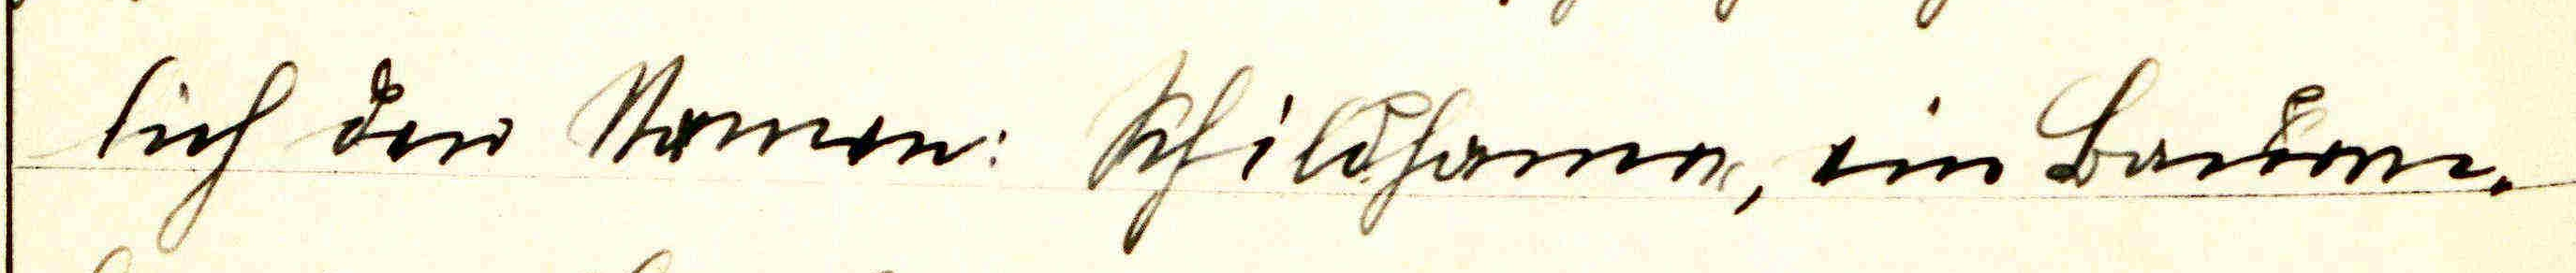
lich den Namen: Schildhame, ein Bauern-
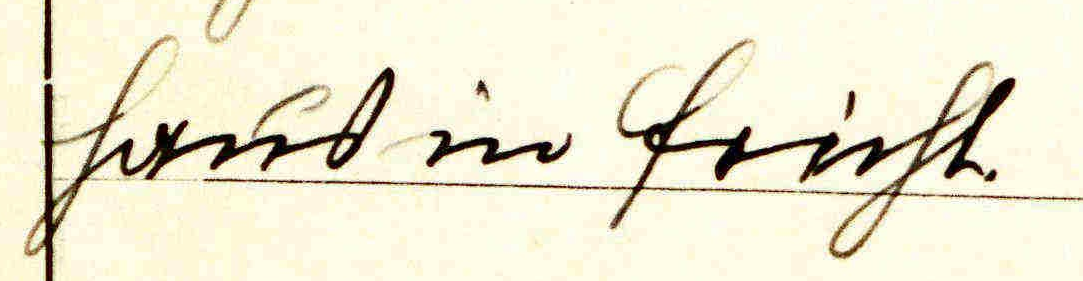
haus in Feicht.
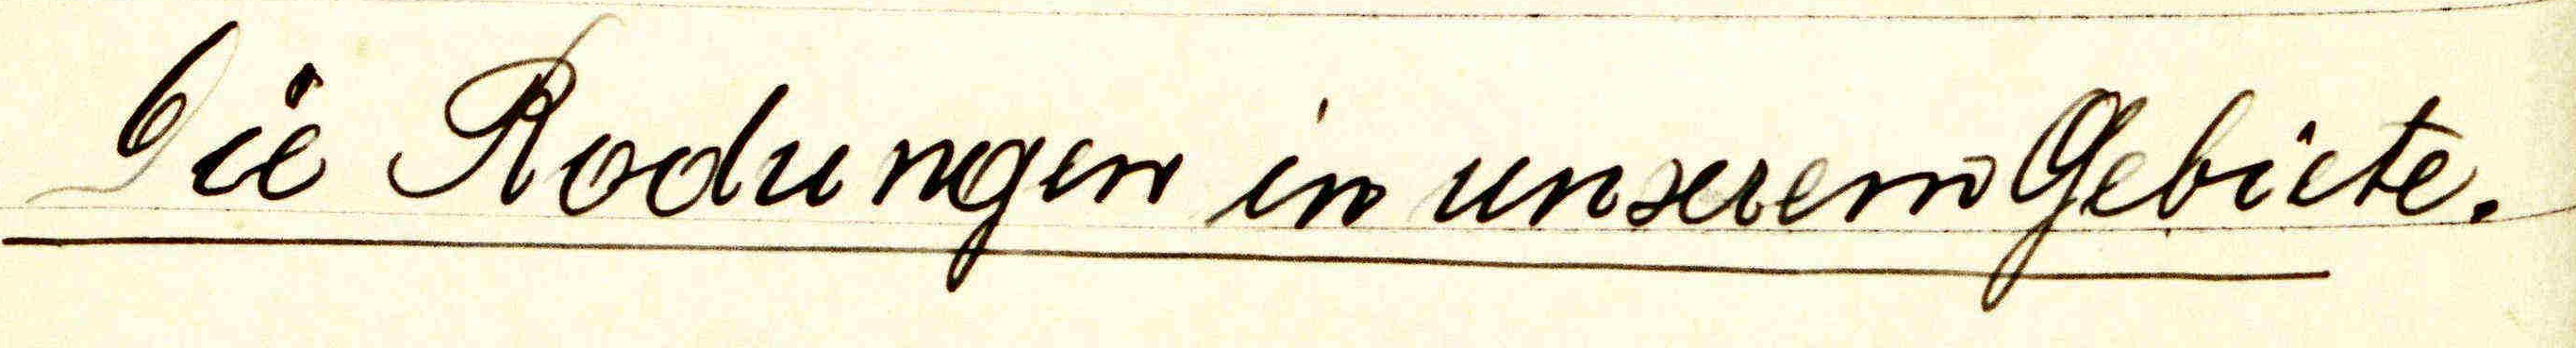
Die Rodungen in unserem Gebiete.
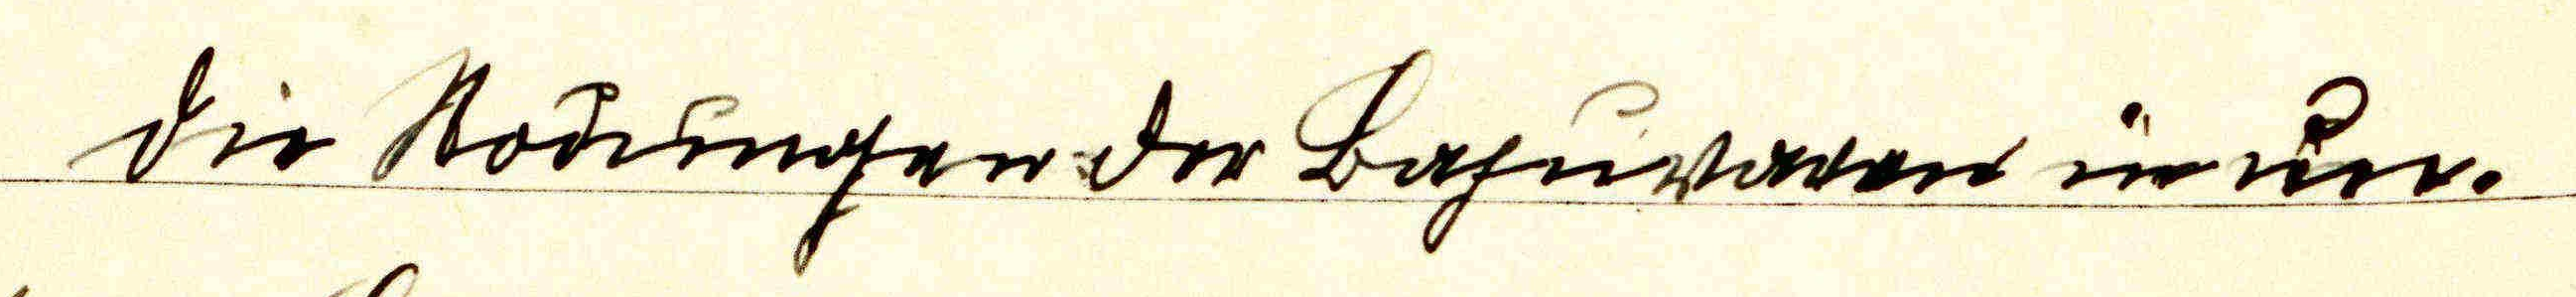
Die Rodungen der Bajuwaren in un-
